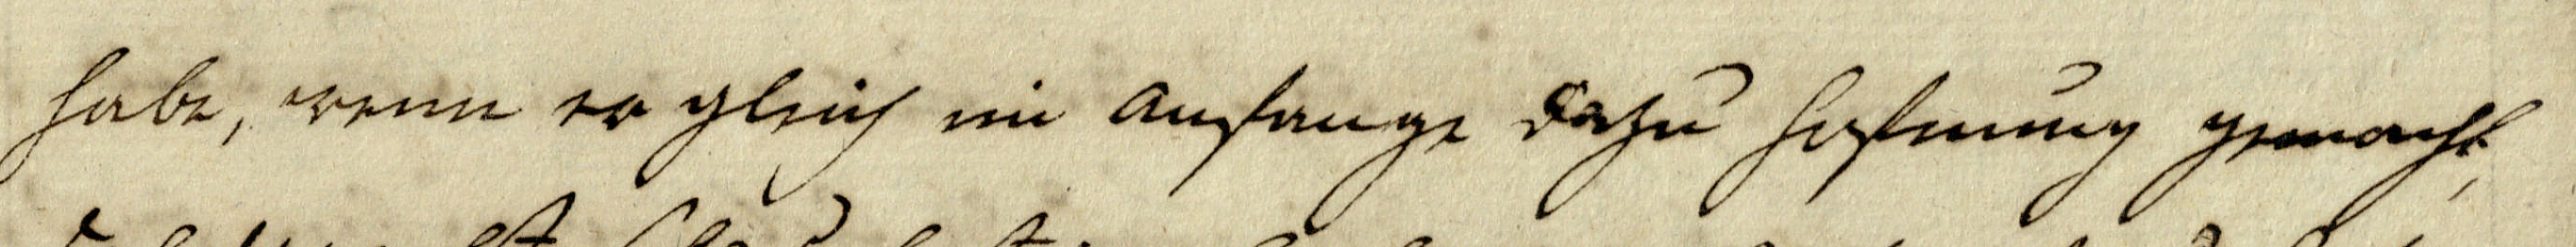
habe, wenn er gleich in Anfange dazu Hofnung gemacht,
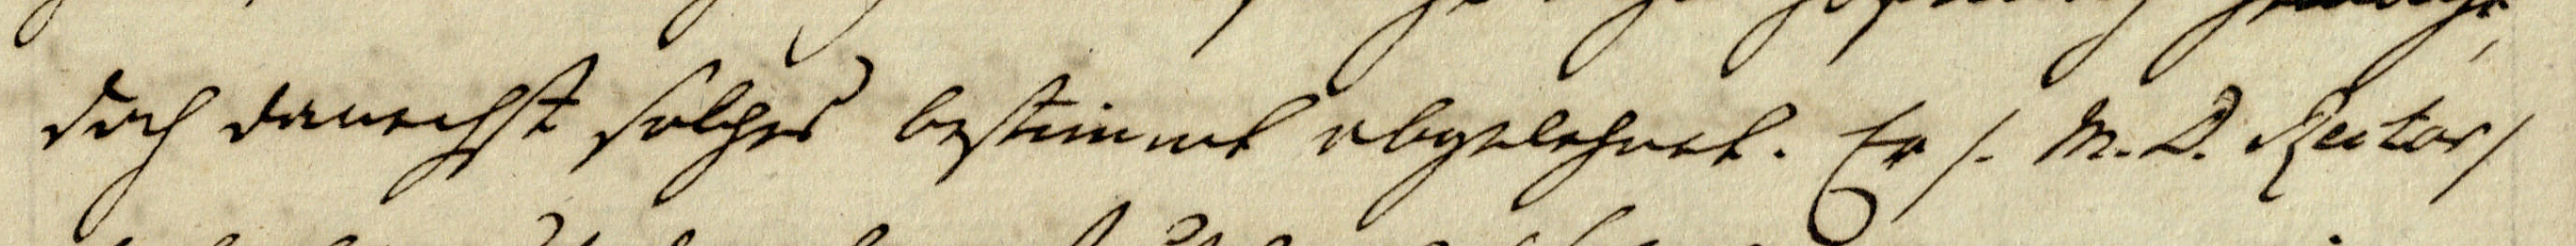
doch danechst solches bestimmt abgelehnet. Er /. M. D. Rector/
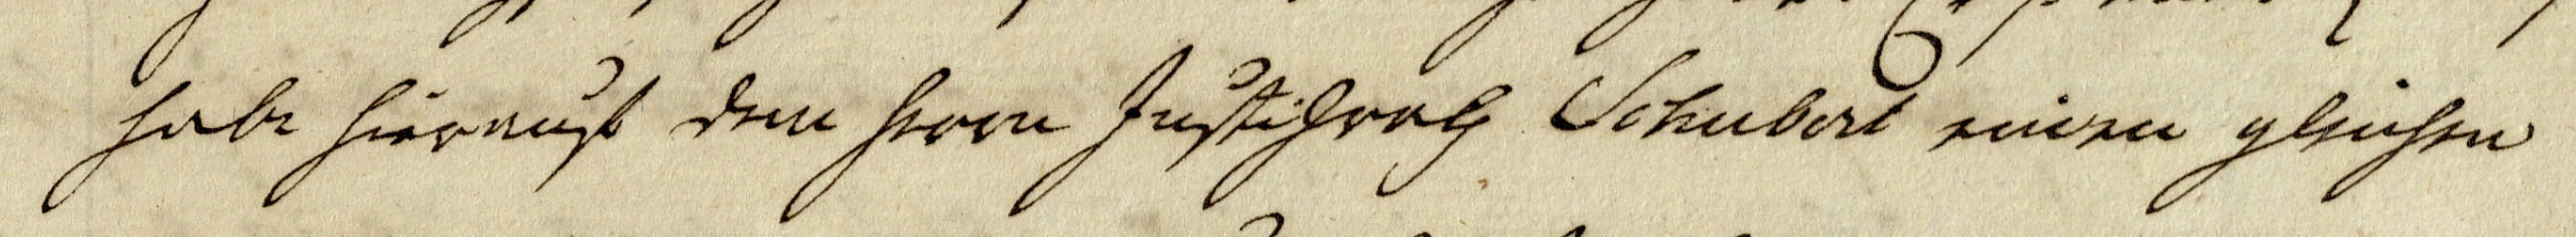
habe hierauf dem Herrn Justizrath Schubert einen gleichen
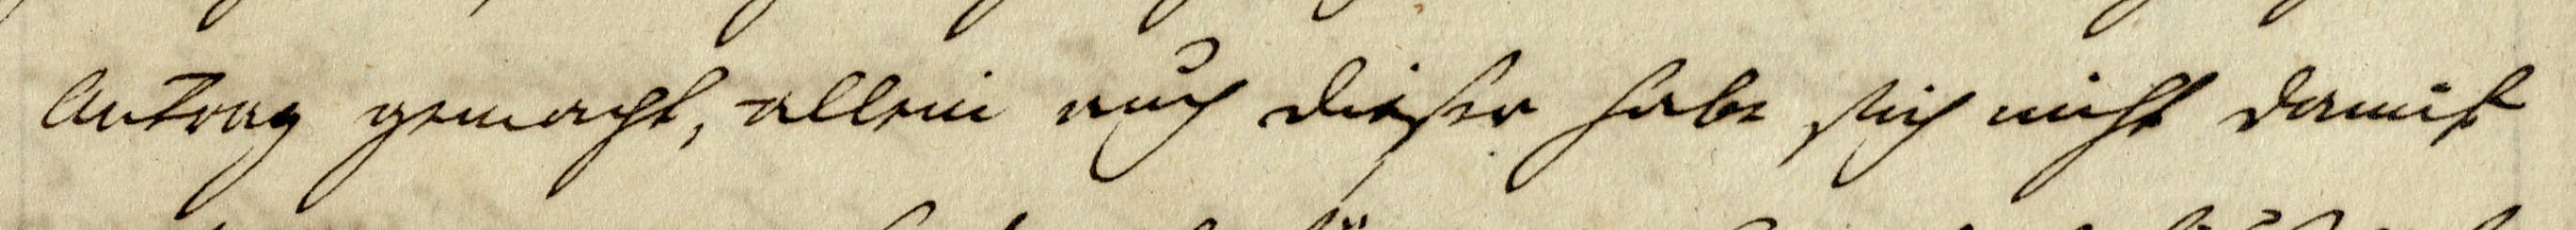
Antrag gemacht, allein auch dieser habe sich nicht damit
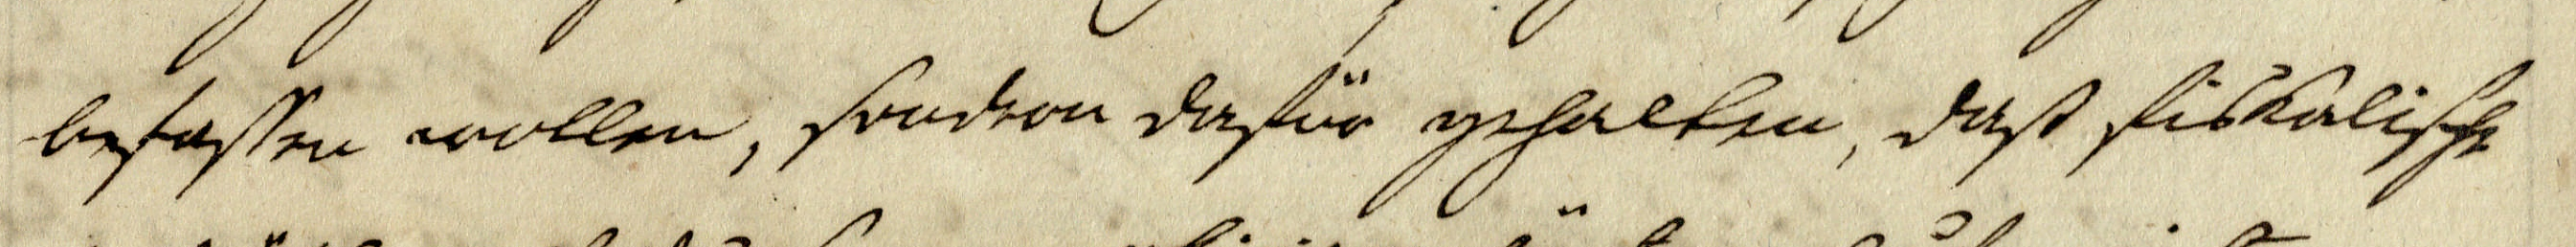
befassen wollen, sondern dafür gehalten, daß fikalische
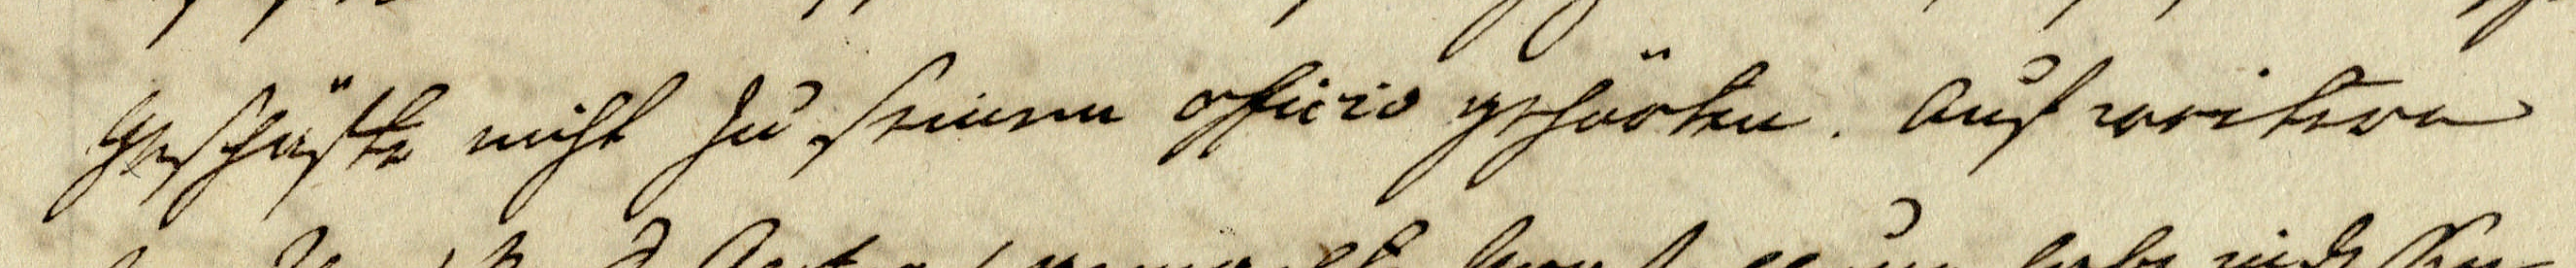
Geschäfte nicht zu seinem officio gehörten. Auf weitere
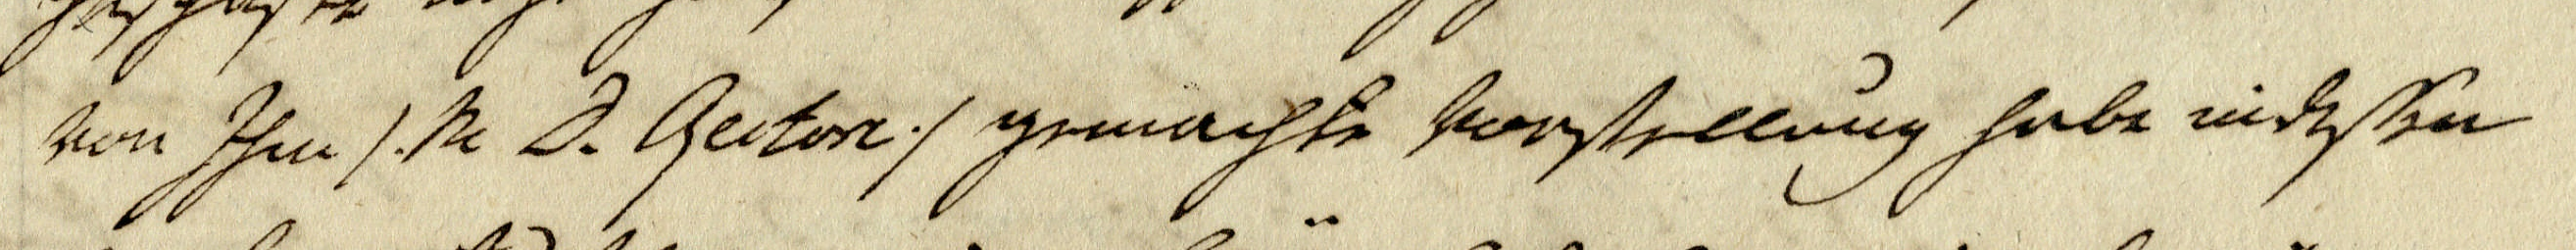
von Ihm /.M. D. Rector./ gemachte Vorstellung habe indessen
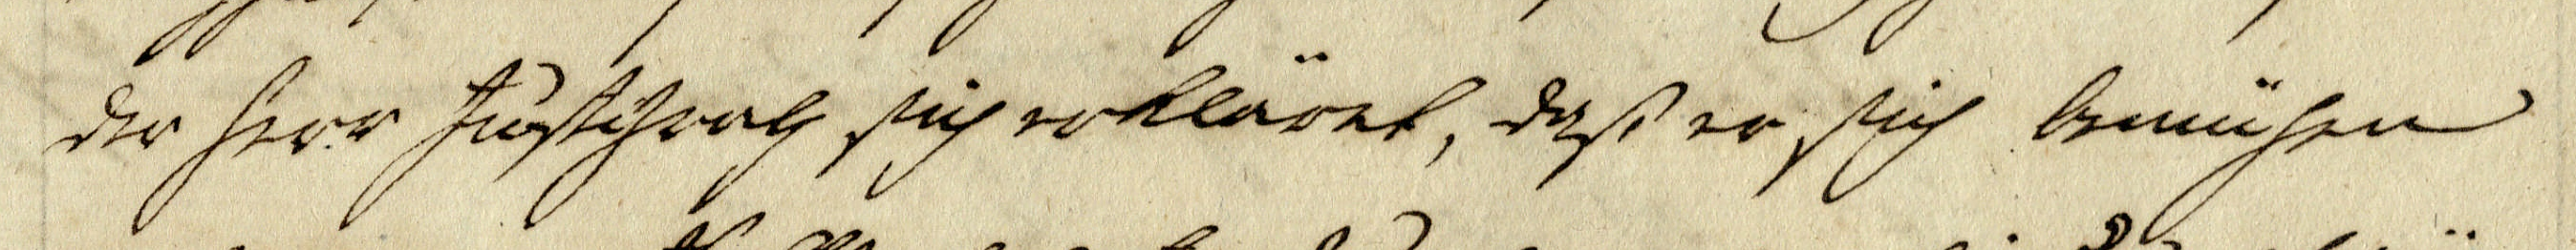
der Herr Justizrath sich erkläret, daß er sich bemühen
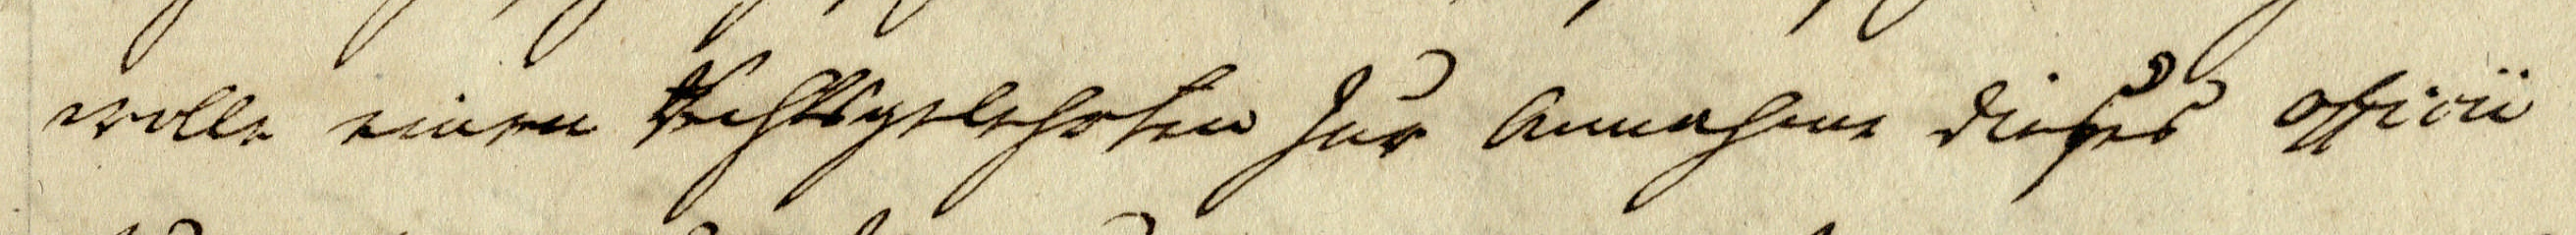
wolle einen Rechtsgelehrten zur Annahme dieses officii
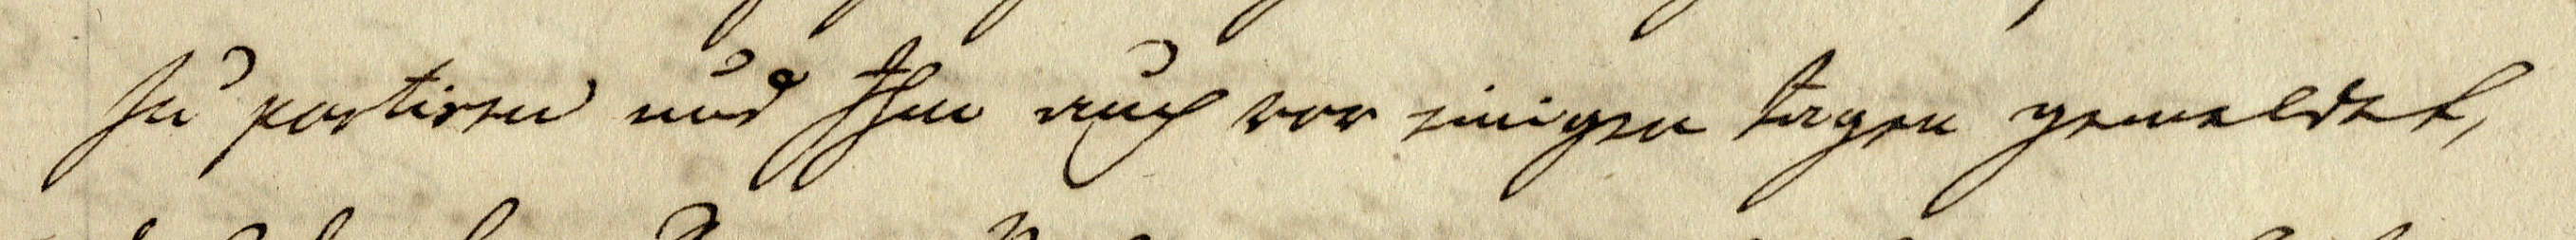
zu portiren und Ihm auch vor einigen Tagen gemeldet,
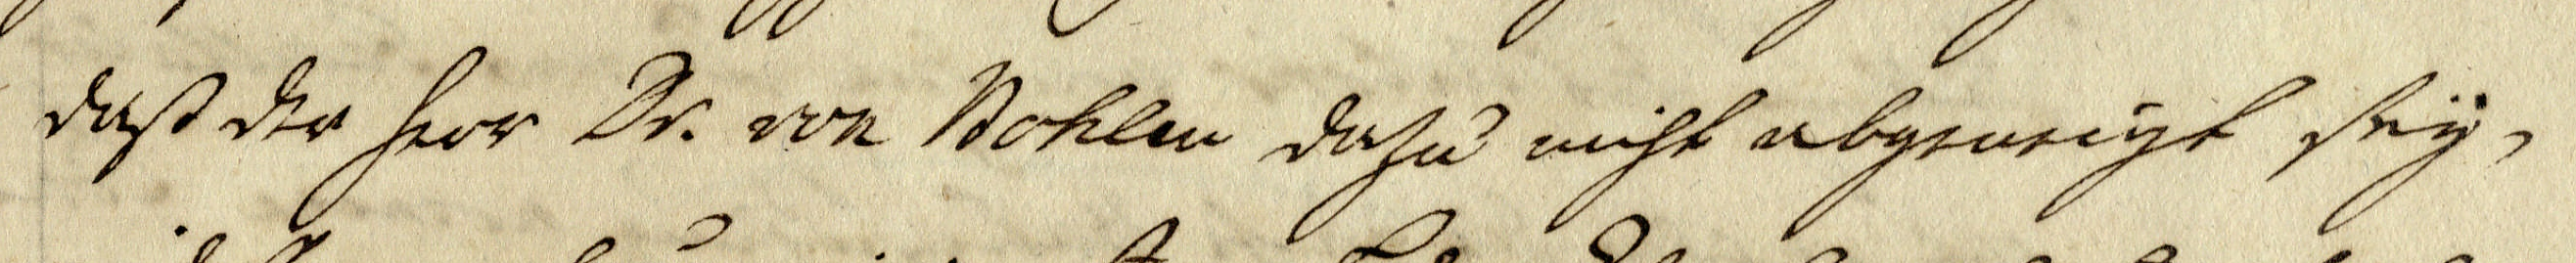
daß der Herr Dr. von Bohlen dazu nicht abgeneigt seÿ,
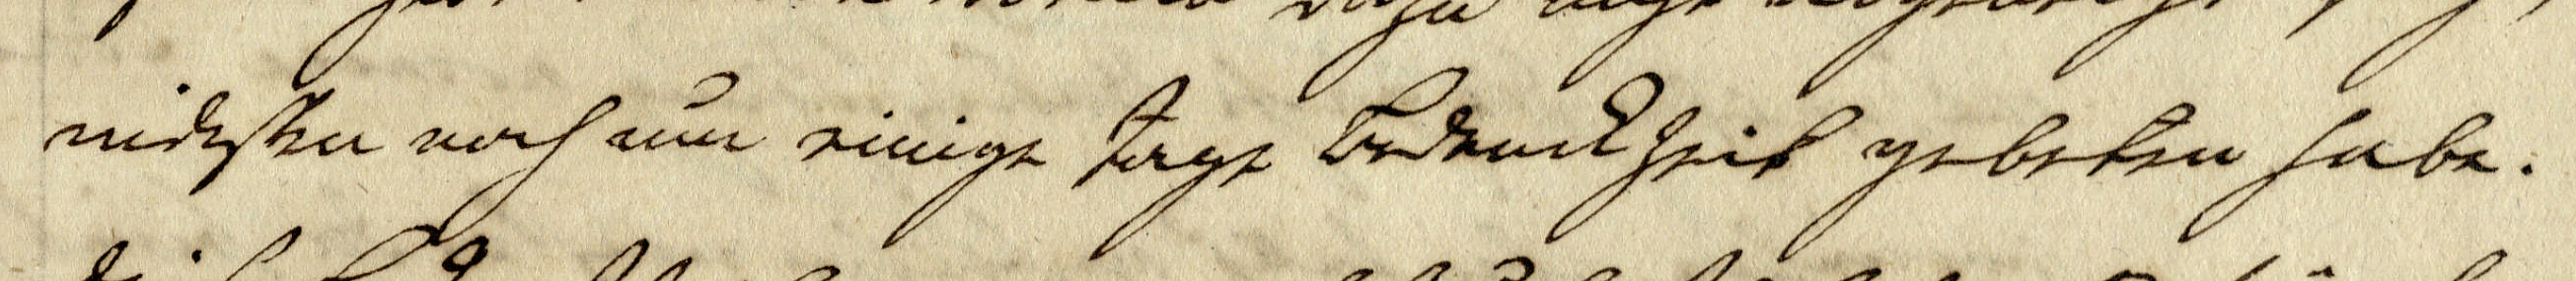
indessen noch um einige Tage Bedenkzeit gebeten habe.
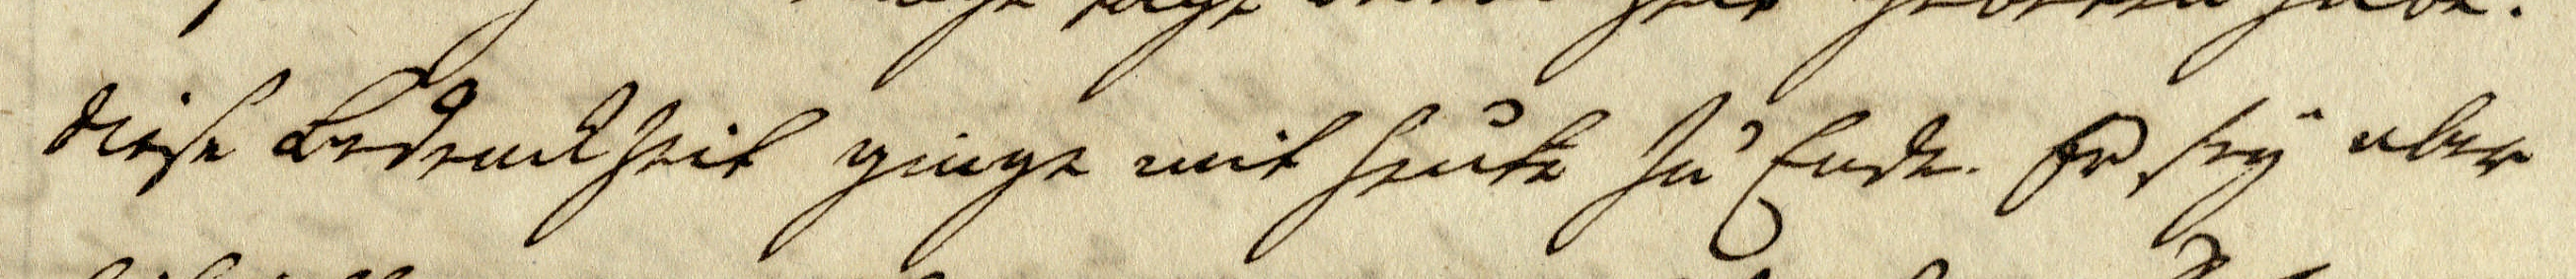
diese Bedenkzeit ginge mit heute zu Ende. Er seÿ aber
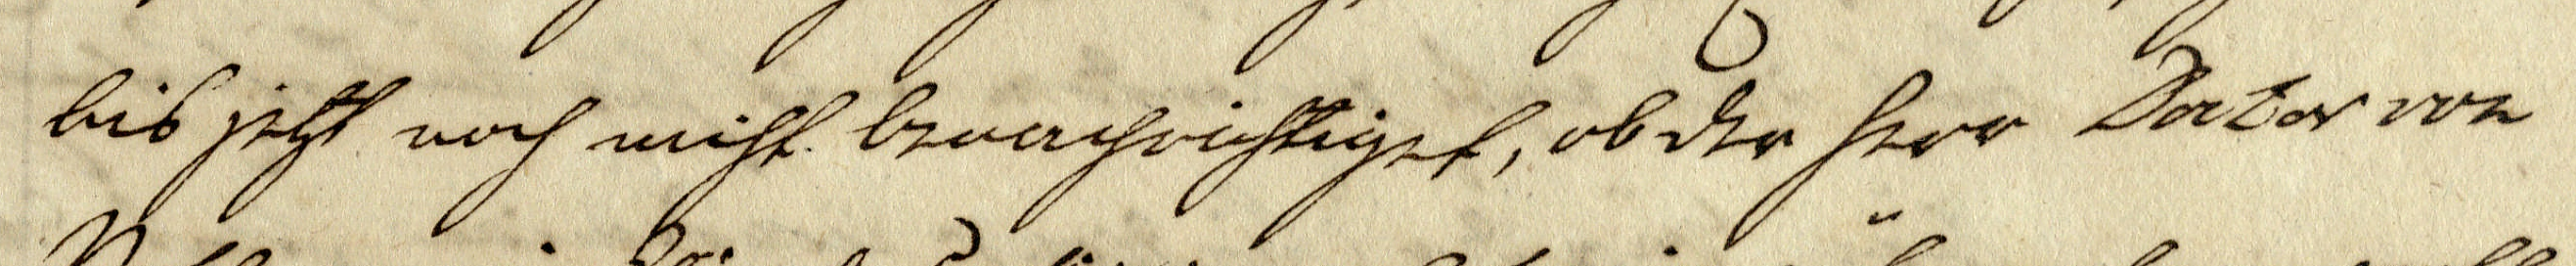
bis jetzt noch nicht benachrichtiget, ob der Herr Doctor von
